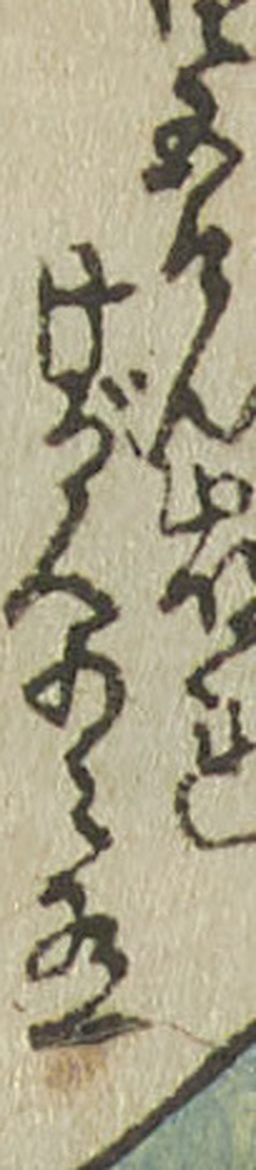けが人少〻有
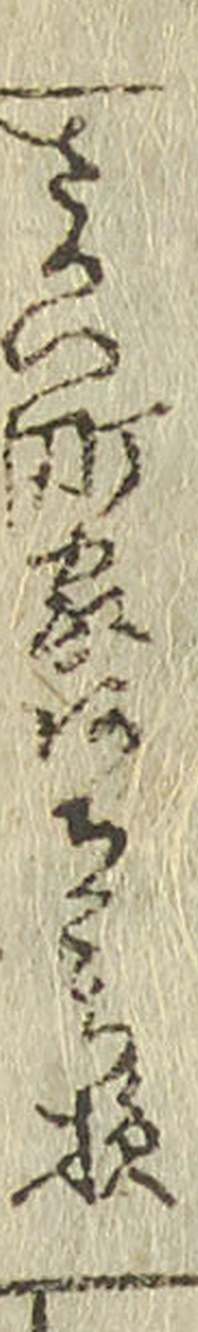さかい町家あちこち損
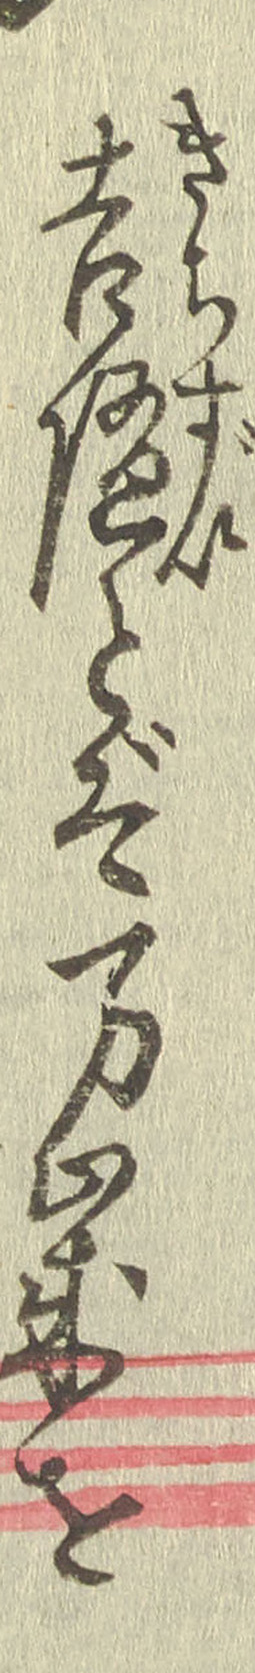吉瑞とぞ万歳を
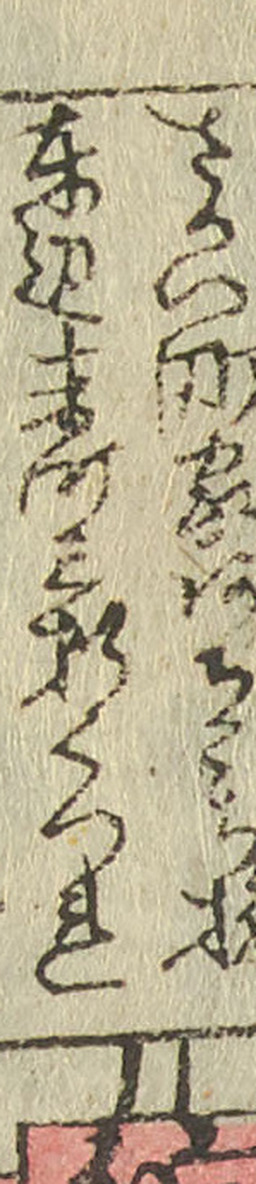東辺末町三軒くづれ
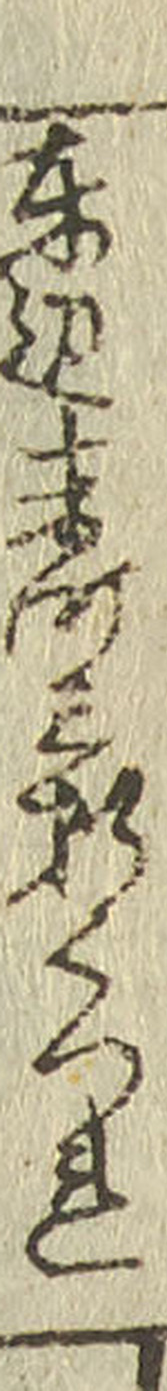東辺末町三軒くづれ
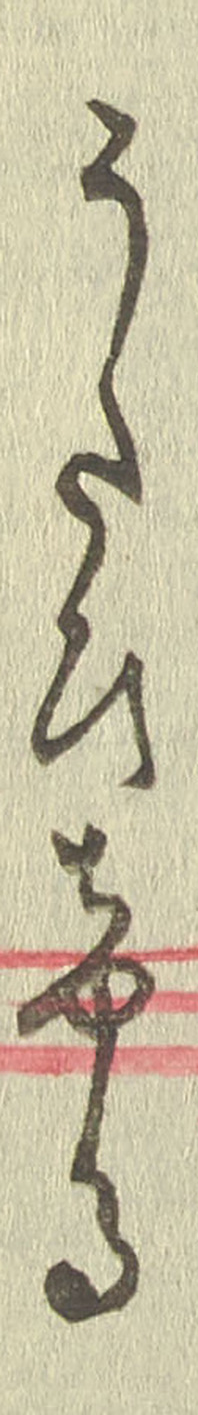うたひける
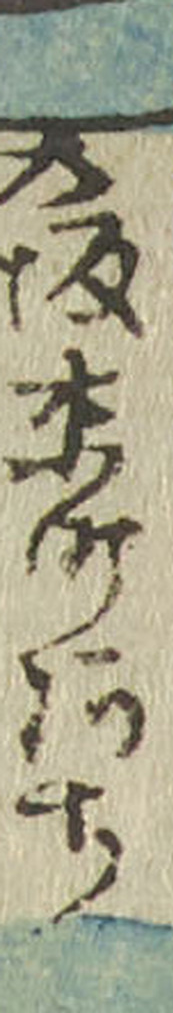大坂京町あち
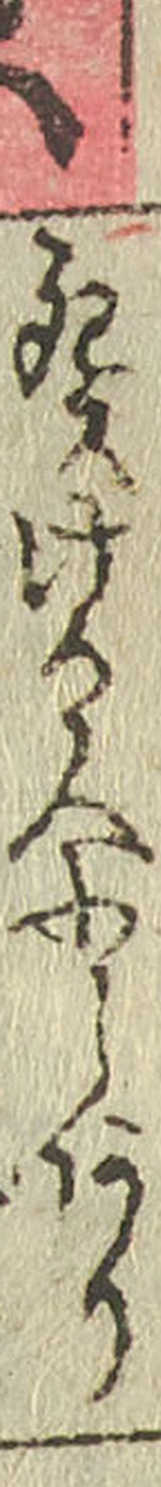死スけか人少しあり
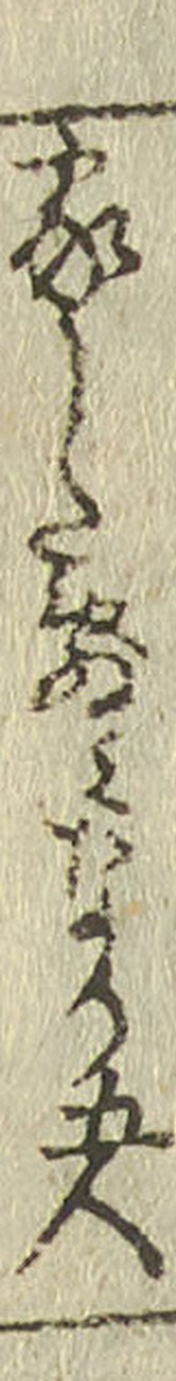家した敷ニなり五人
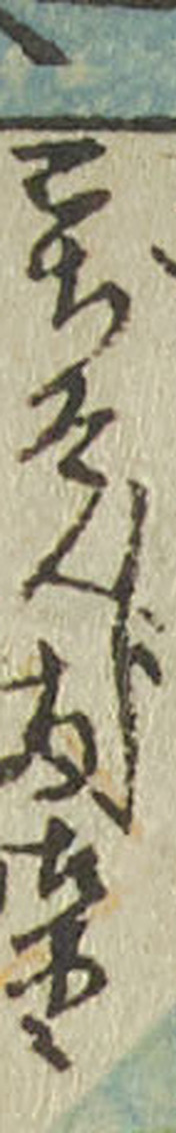こちそんじ両御所ニ
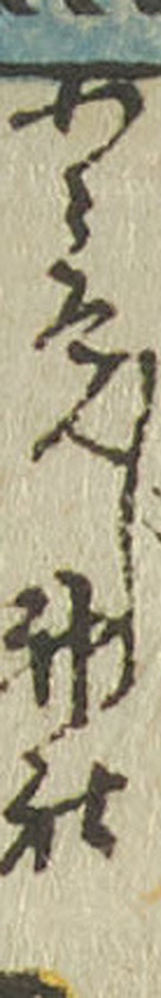少〻そんじ神社
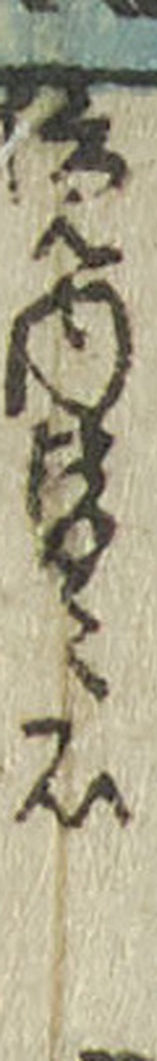境内皆〻石
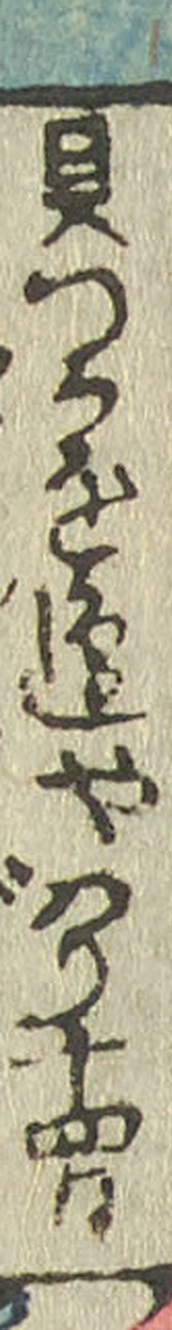貝つか近邊やハり十四日
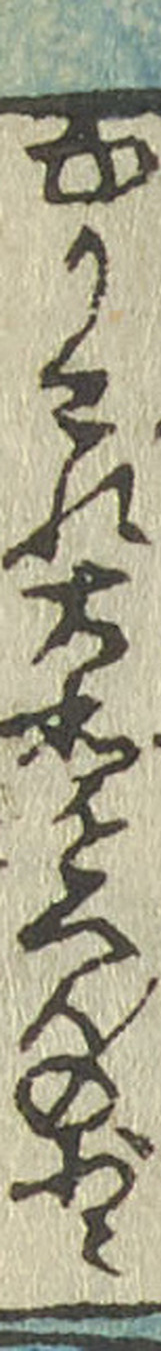ゆりこれ大和近へんの少〻
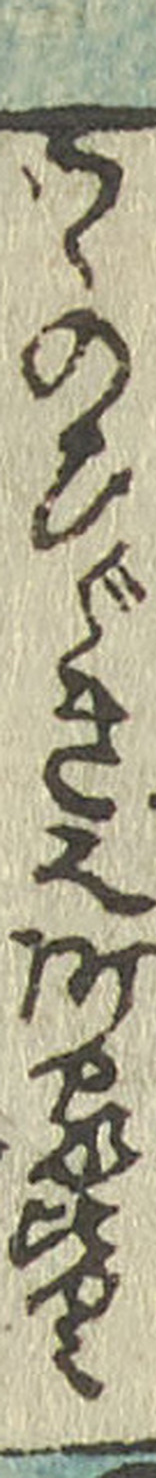ツヽのひゞき也町家皆〻
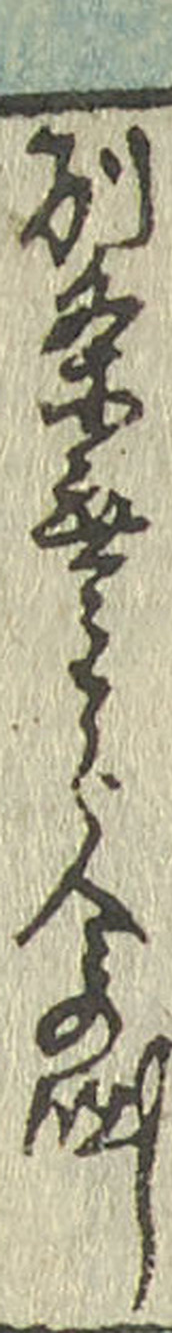別条無之と人〻の咄し
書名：大地震早引方角附
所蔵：東京大学総合図書館 General Library in the University of Tokyo, JAPAN
